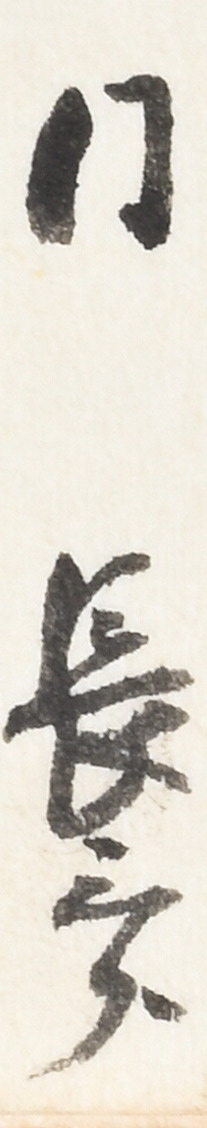同長三郎
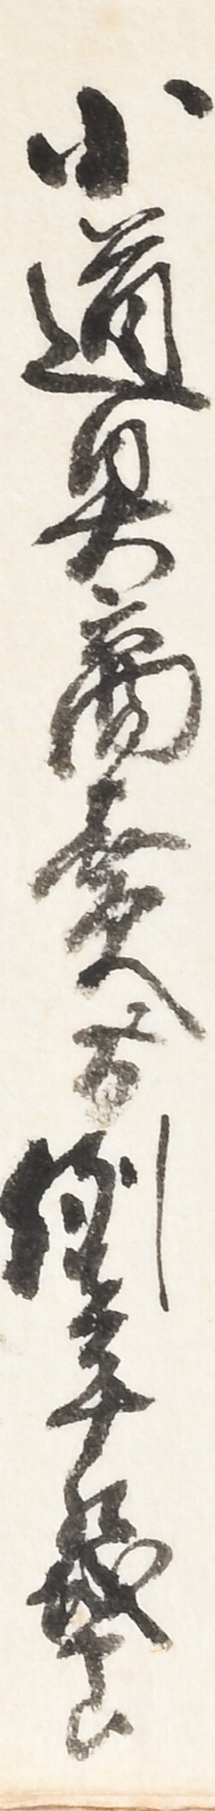小道具商売ニ而例年罷越申候
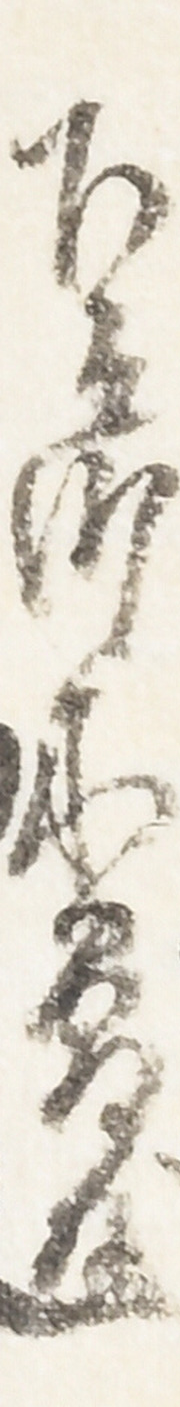下モ町木曽屋
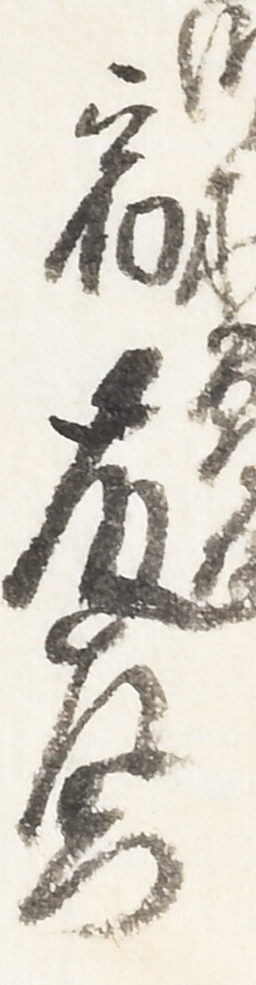宿籐左衛門
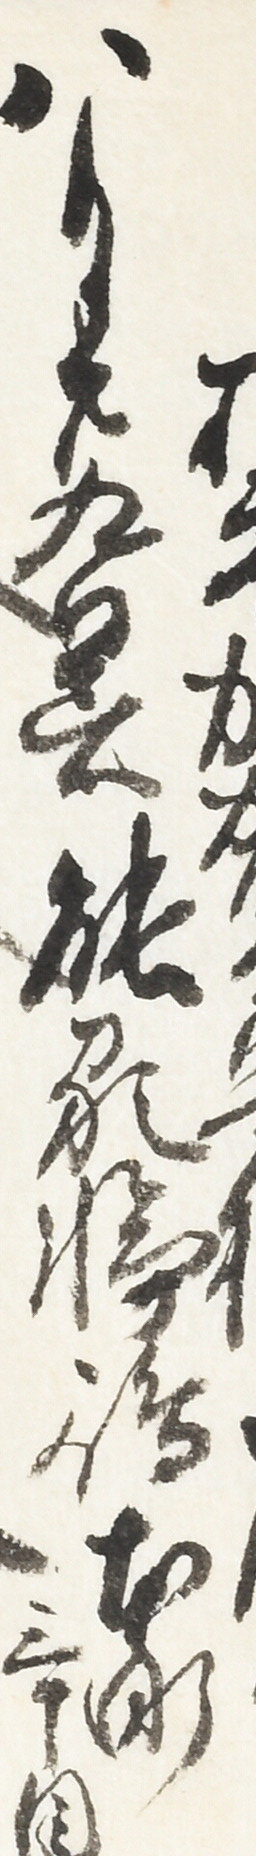八月廿九日着能州輪嶋本町
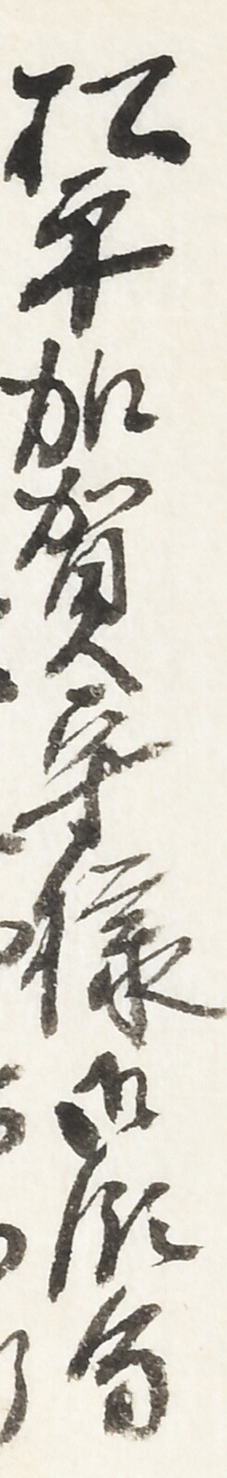松平加賀守様御領分
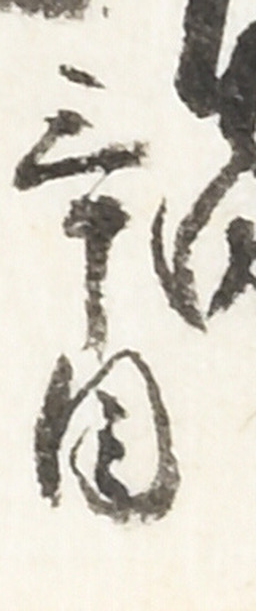三丁目
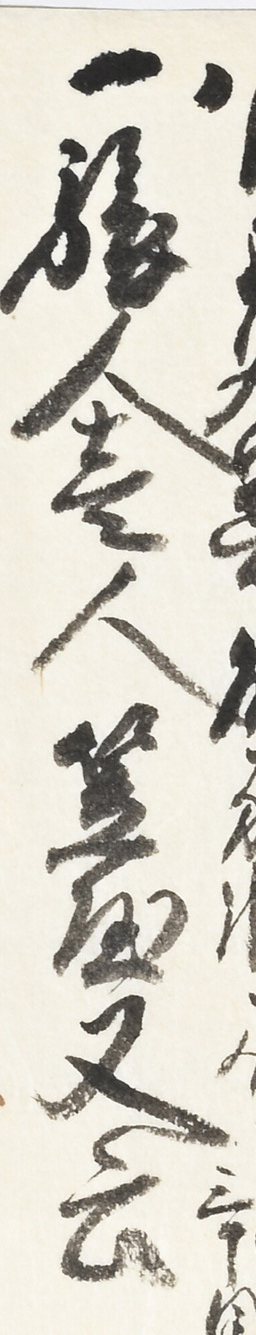一旅人壱人笠屋又六
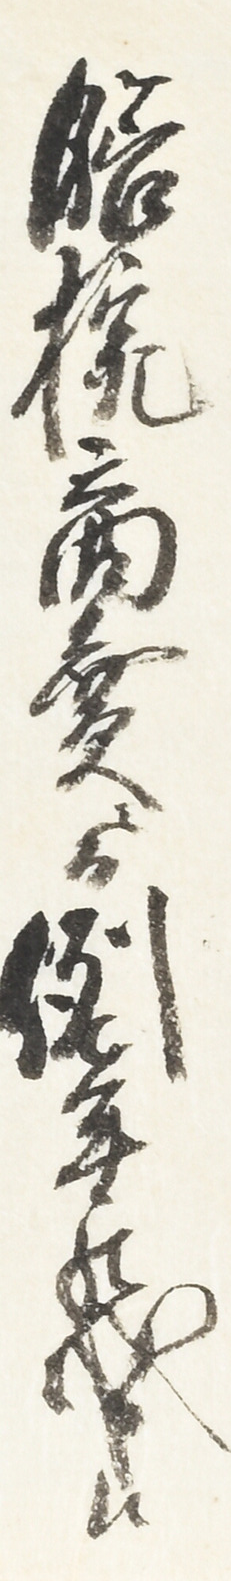膳椀商売ニ而例年罷越申候
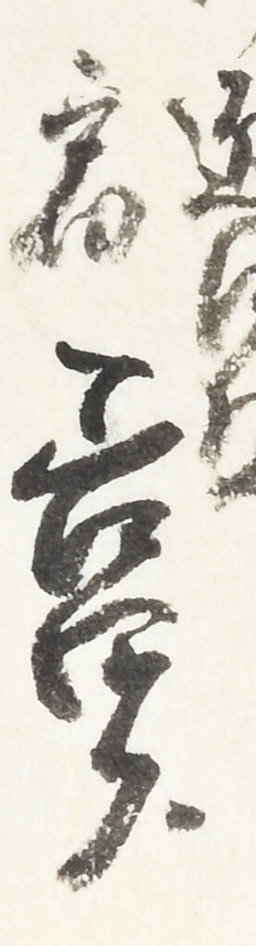宿善四郎
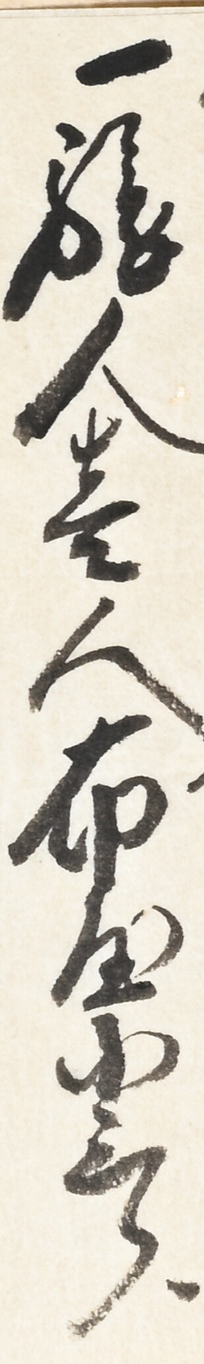一旅人弐人中村屋平三郎
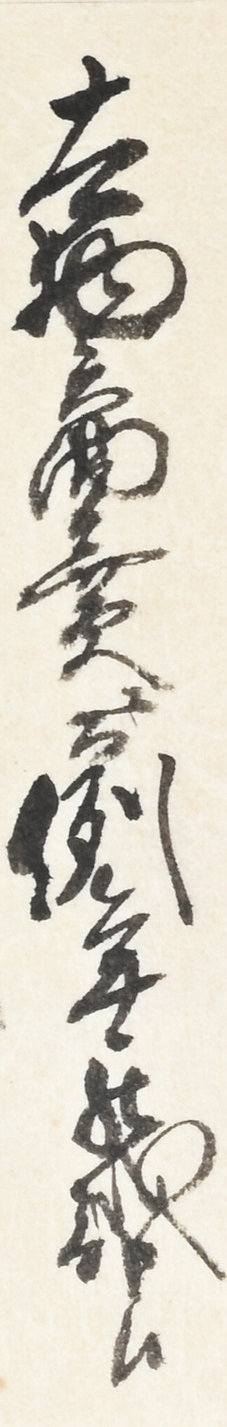小間物商売ニ而例年罷越申候

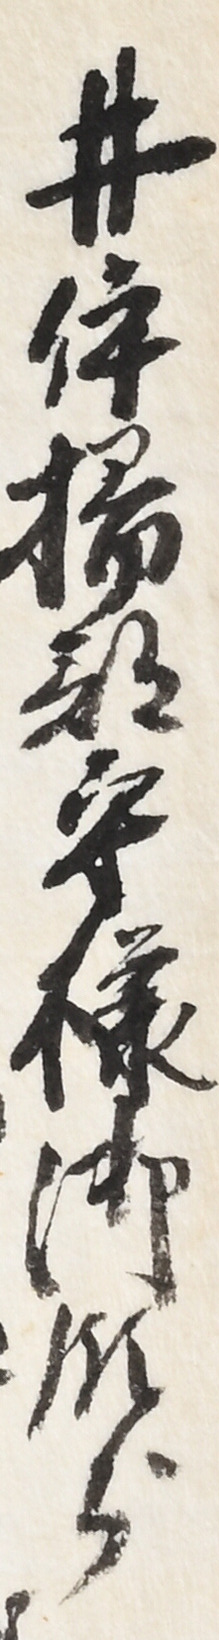井伊掃部守様御領分
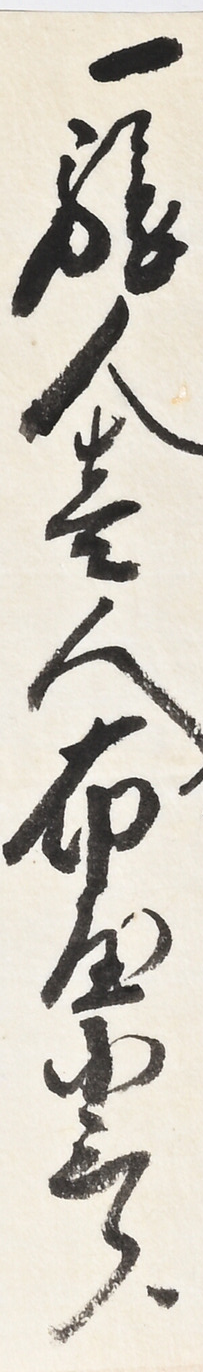一旅人壱人布屋小三郎
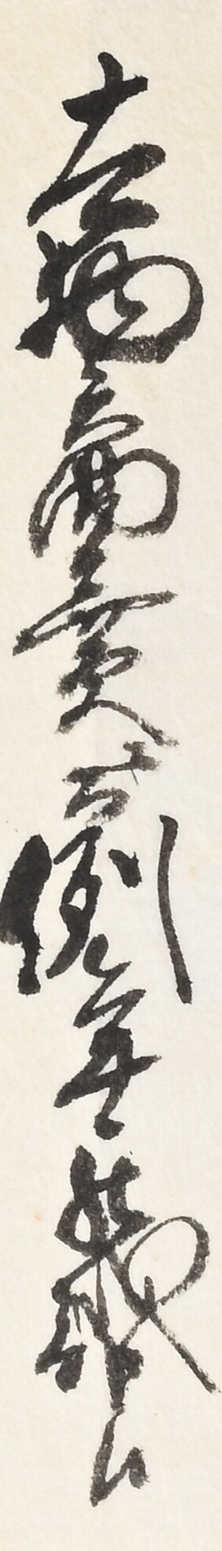左物商売ニ而例年罷越申候
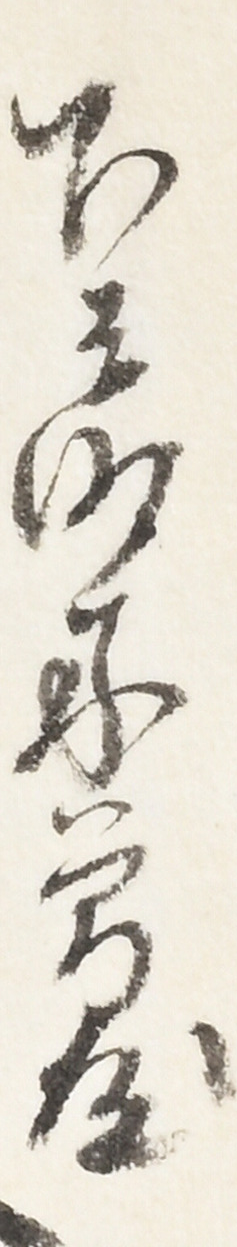下モ町木曽屋
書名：旅人泊控帳
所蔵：伊那市立高遠町図書館・合同会社AMANE
